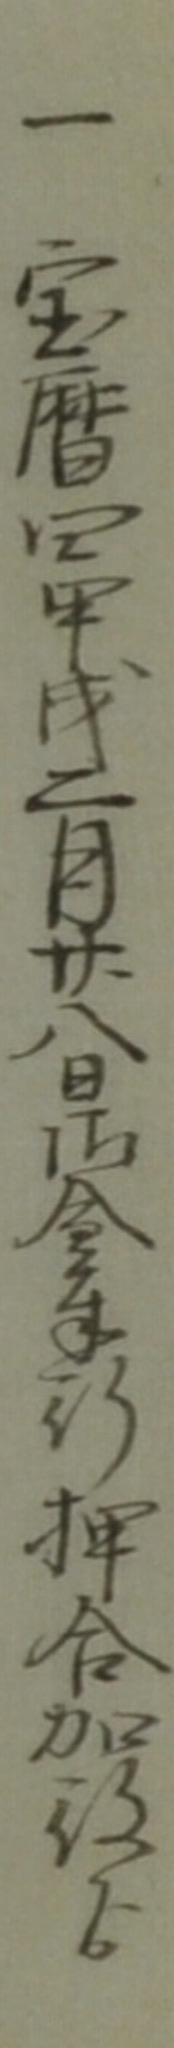一宝暦四甲戌二月廿八日御金奉行押合加役ゟ
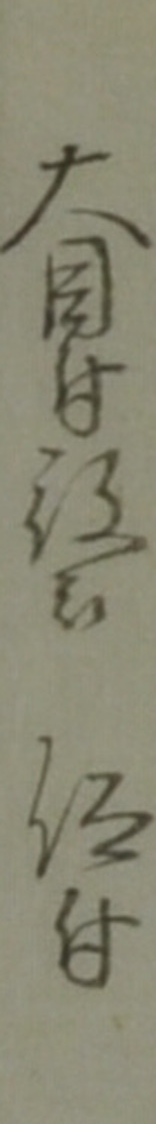大目付役被仰付
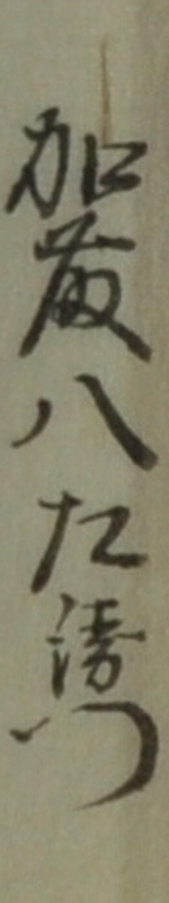加藤八左衛門
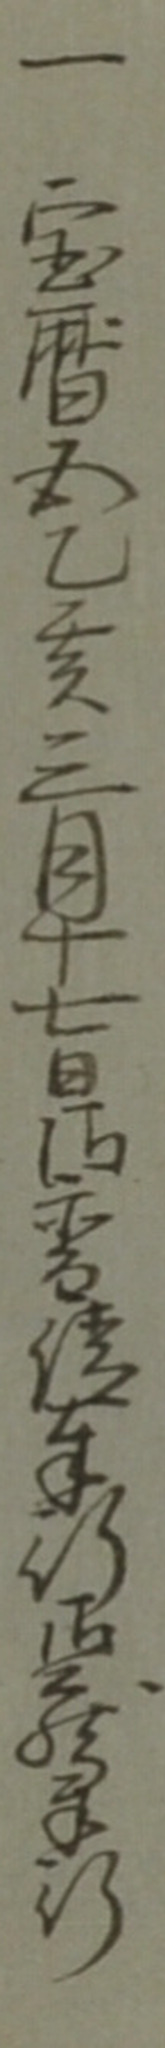一宝暦五乙亥三月十七日御普請奉行御蔵奉行
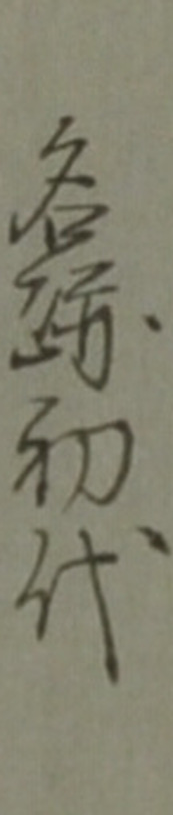名跡初代
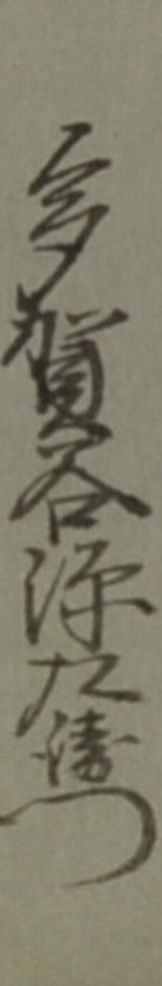多賀谷源左衛門
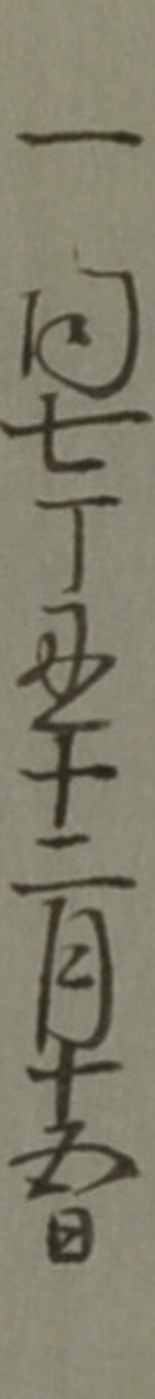一同七丁丑十二月十五日
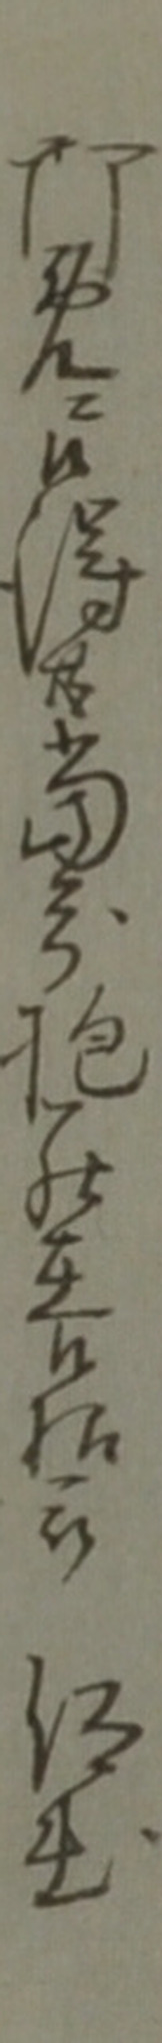御免ニ候得共当分抱罷在候様被仰出
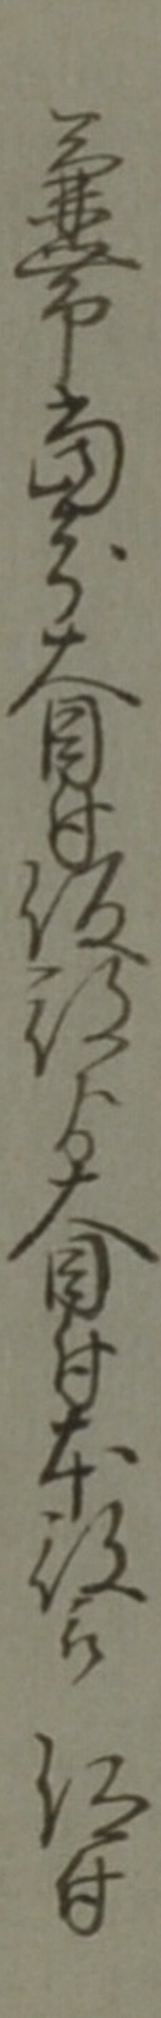兼帯当分大目付仮役ゟ大目付本役被仰付
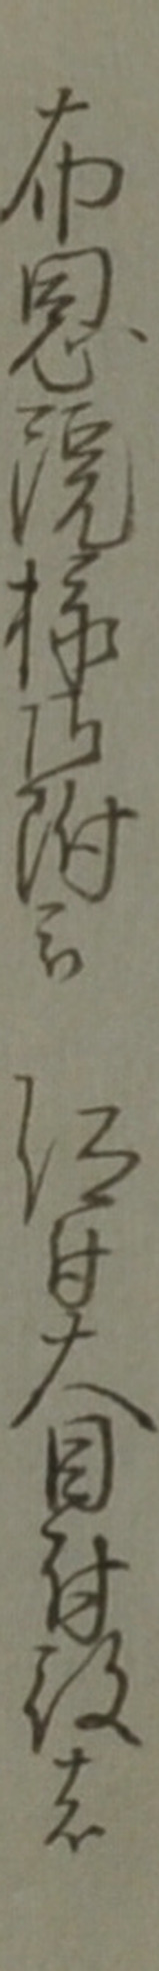布恩院様御附被仰付大目付役は
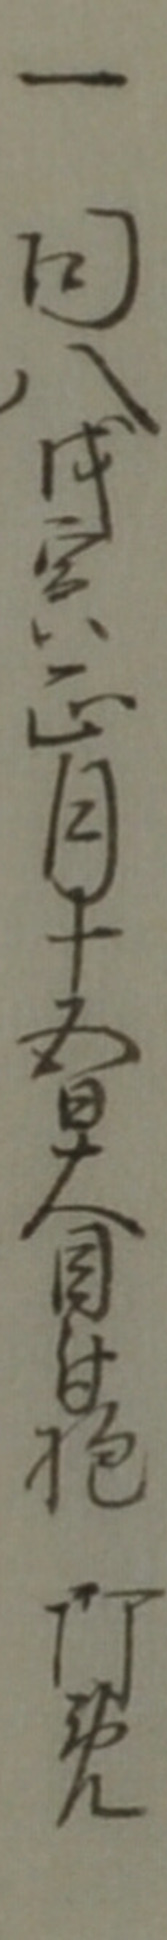一同八戊寅正月十五日大目付抱御免
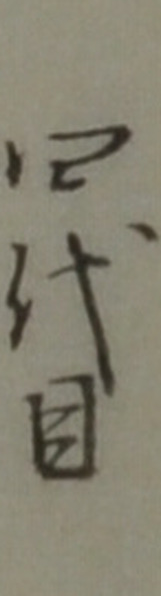四代目
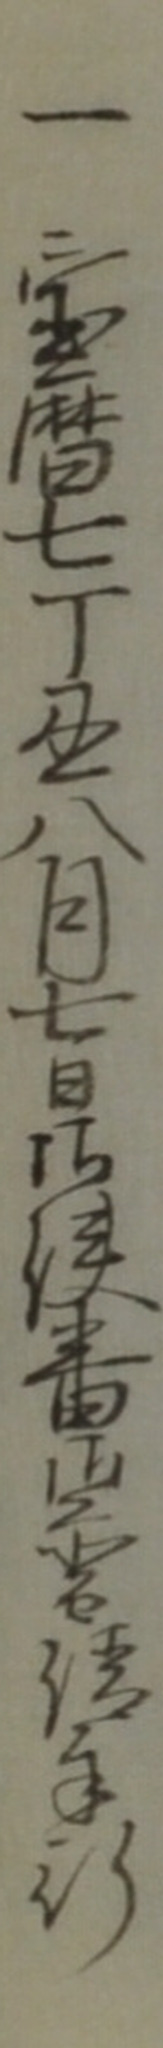一宝暦七丁丑八月七日御使番御普請奉行
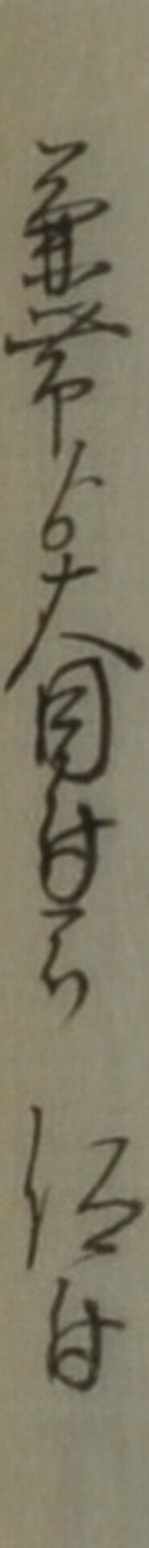兼帯ゟ大目付被仰付
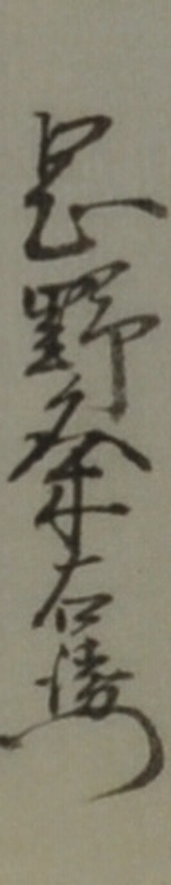岡野粂右衛門
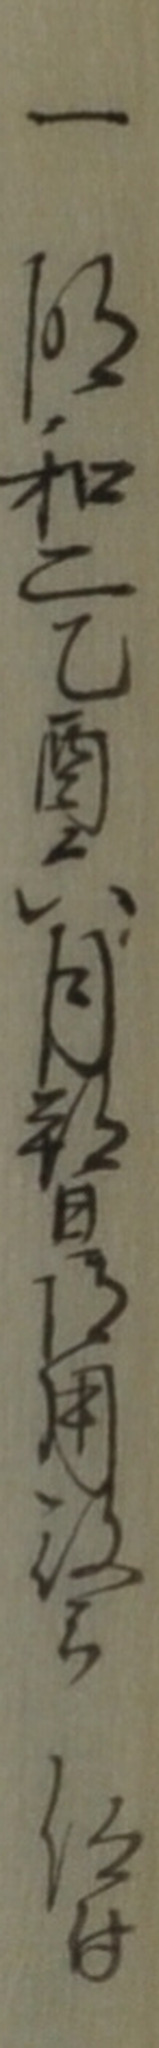一明和二乙酉六月朔日御用役被仰付
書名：諸御役代々録（三）
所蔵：伊那市立高遠町図書館・合同会社AMANE
